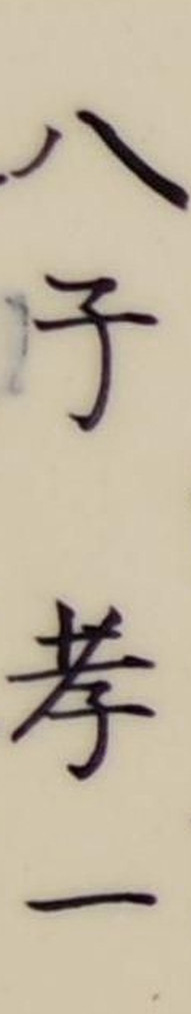八子孝一
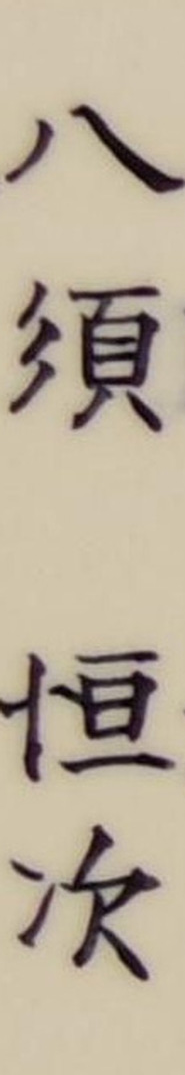八須恒次
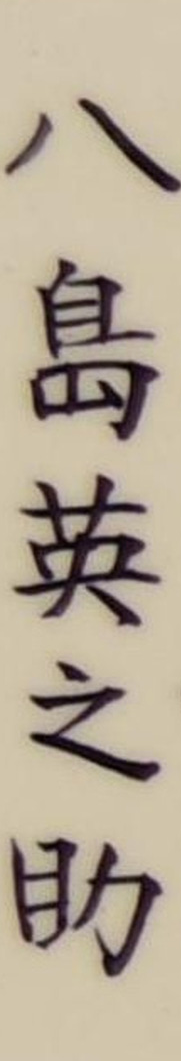八島英之助
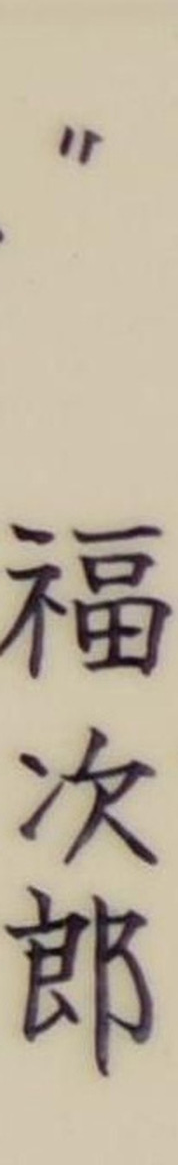福次郎
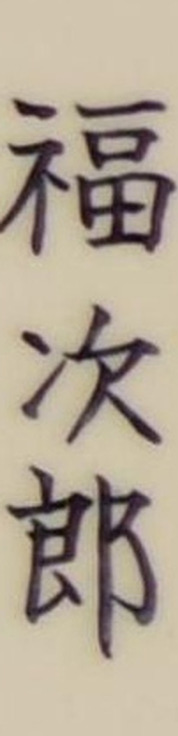福次郎
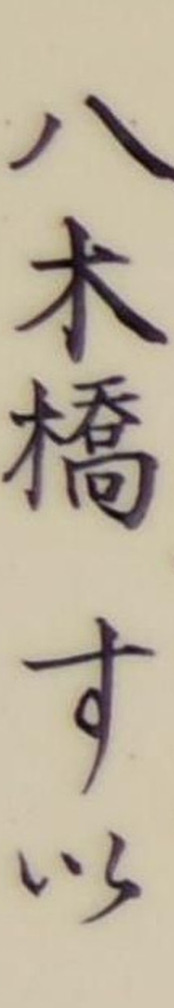八木橋すい

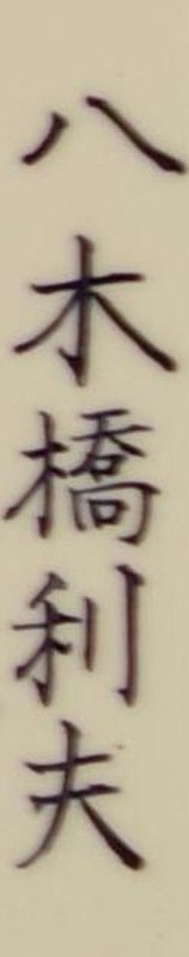八木橋利夫
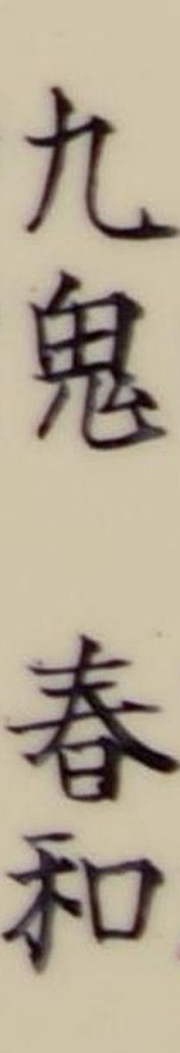九鬼春和
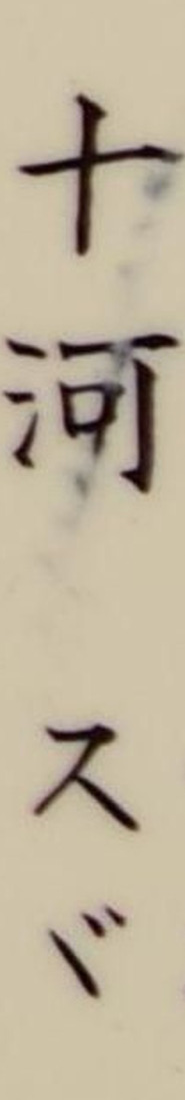十河スズ
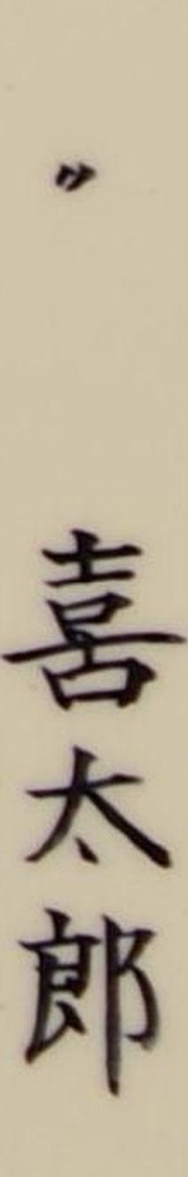喜太郎
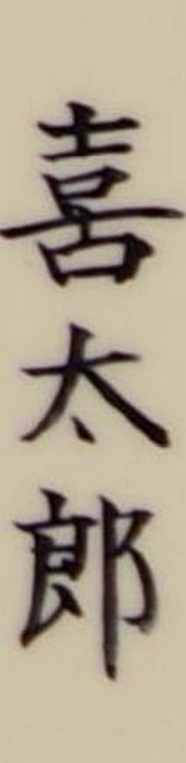喜太郎
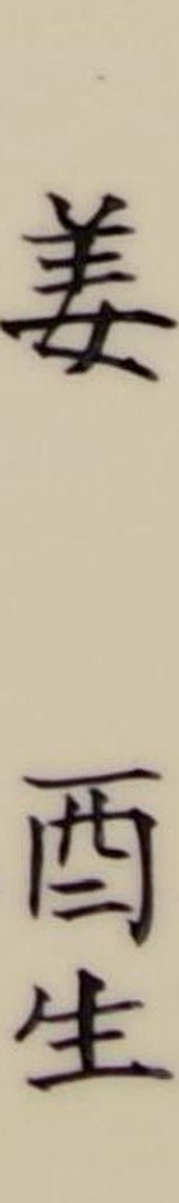姜酒生
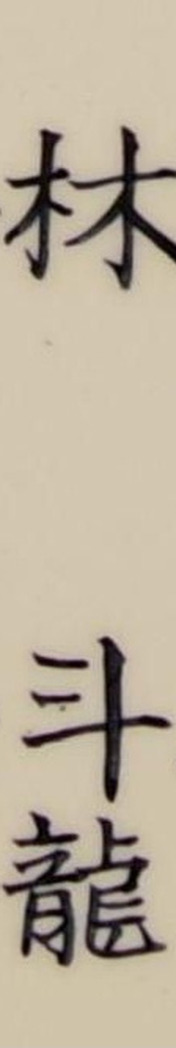林斗龍
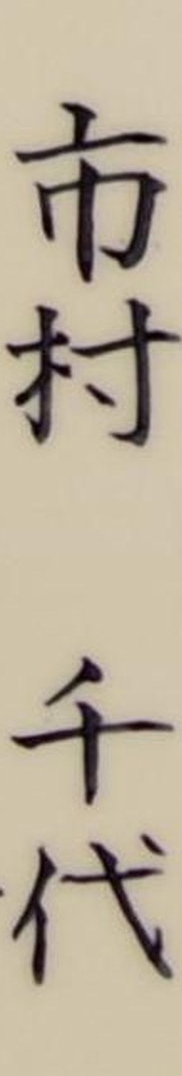市村正代
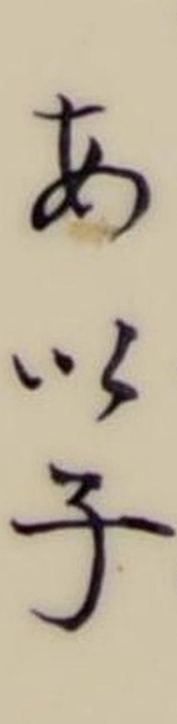あい子
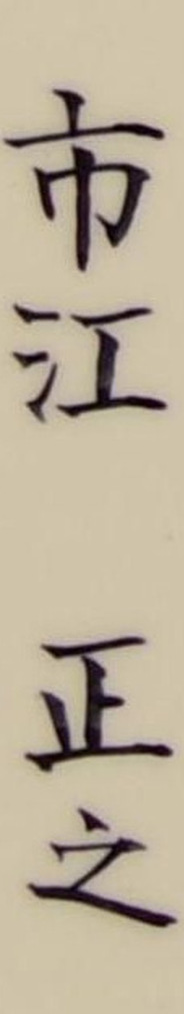市江正之
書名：E~L
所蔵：高野山金剛峯寺
